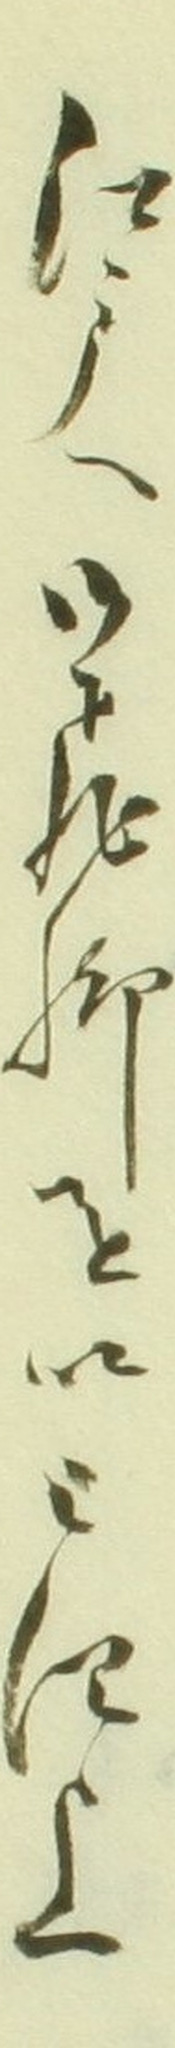江戸へ御飛脚を以被仰上
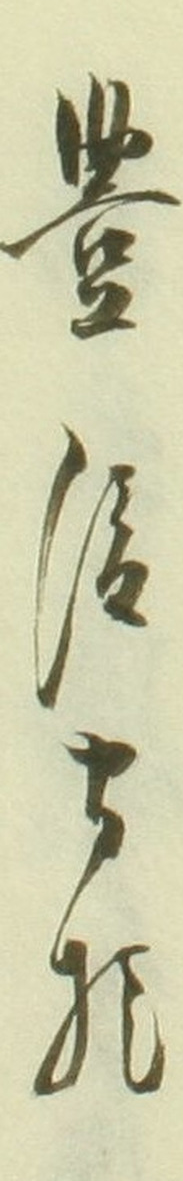豊後守様
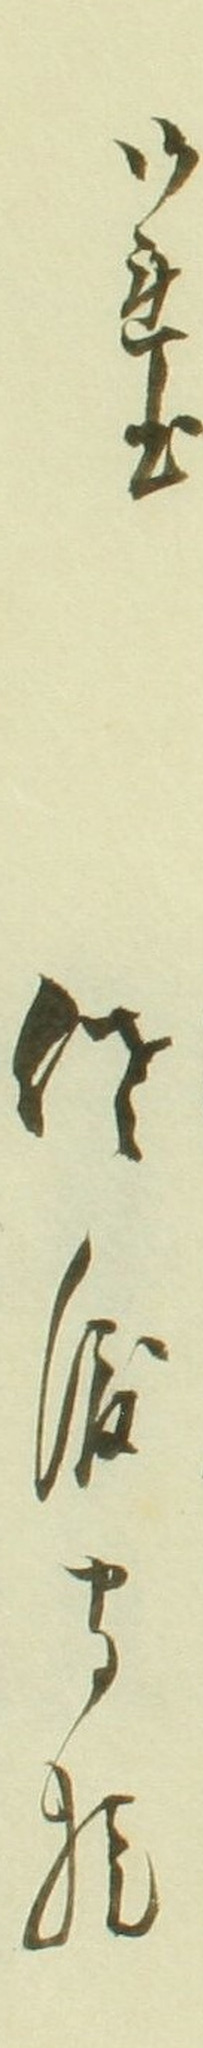佐渡守様
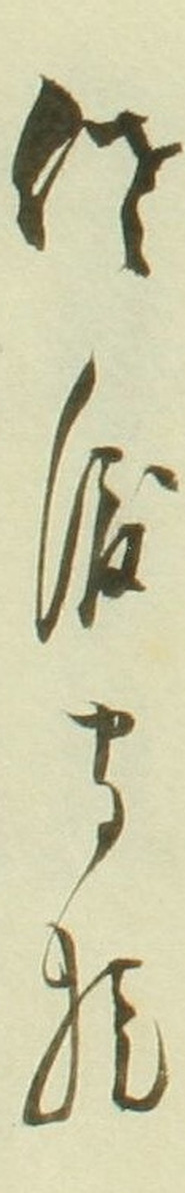佐渡守様
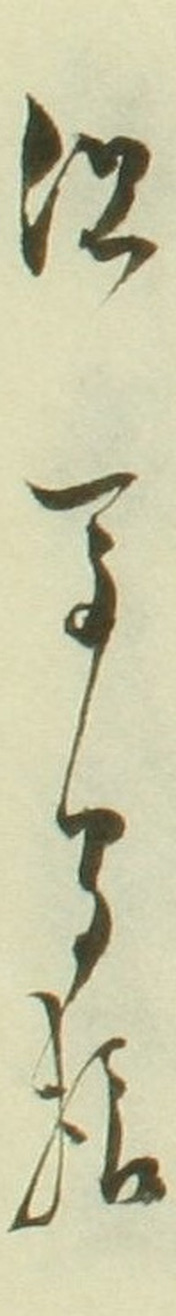但馬守様
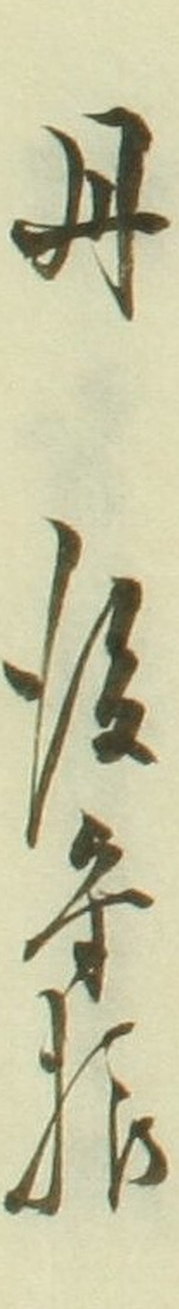丹後守様
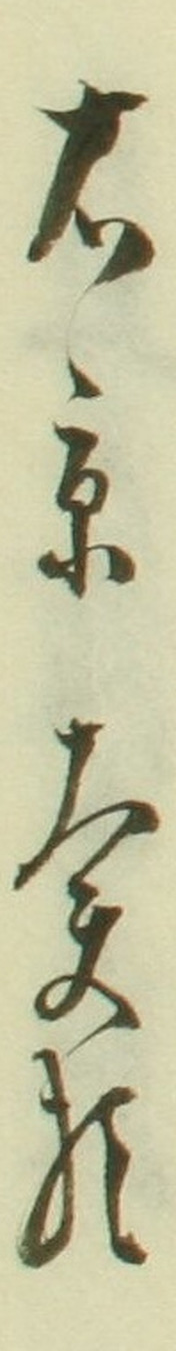右京大夫様

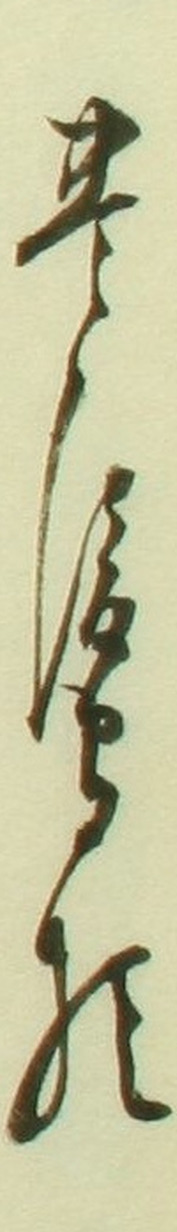豊後守様
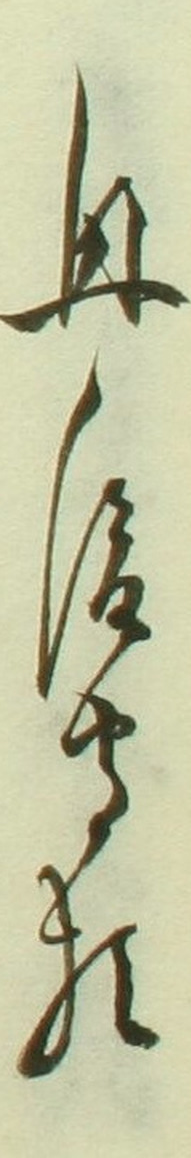豊後守様
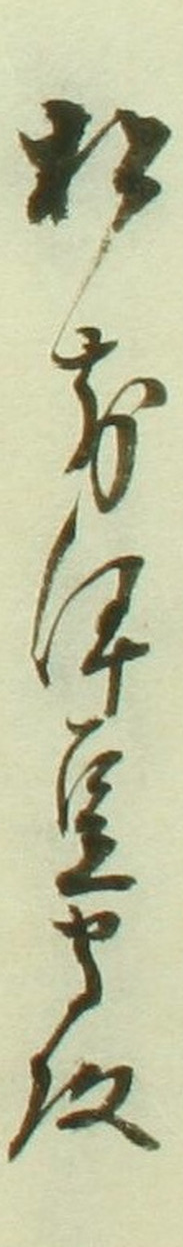松前伊豆守殿
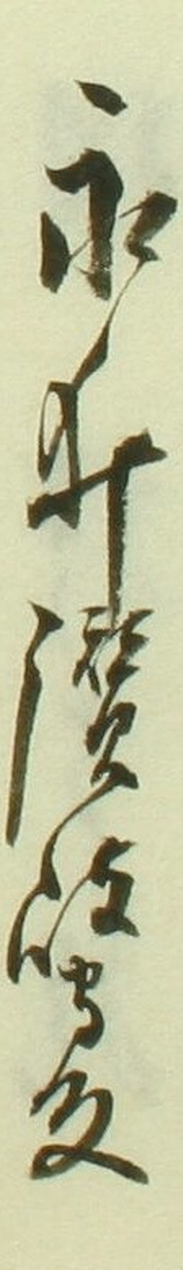永井讃岐守殿
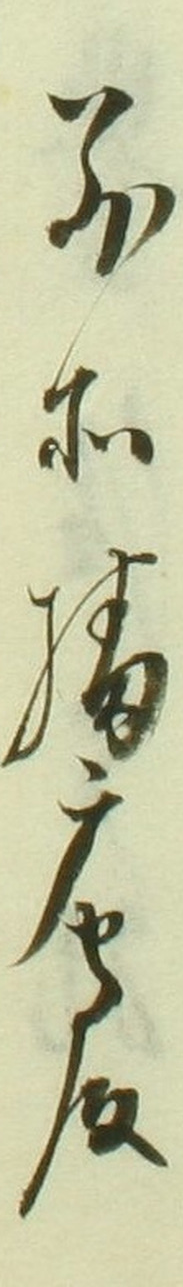別所播磨守殿
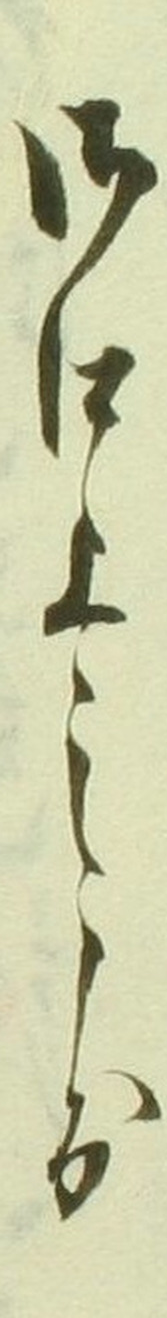御口上之分
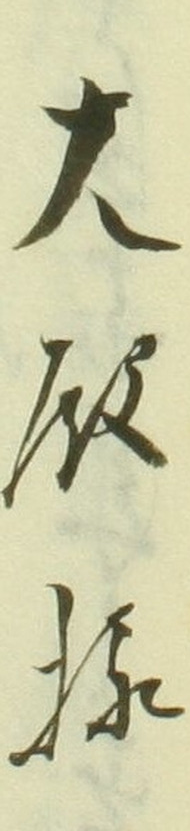大殿様
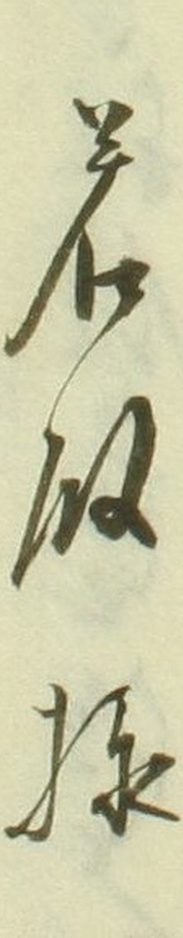若殿様
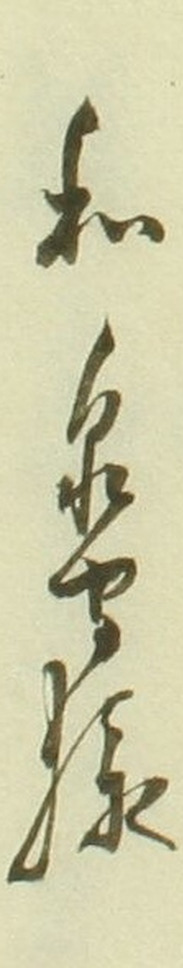和泉守様
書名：異国船漂着記
